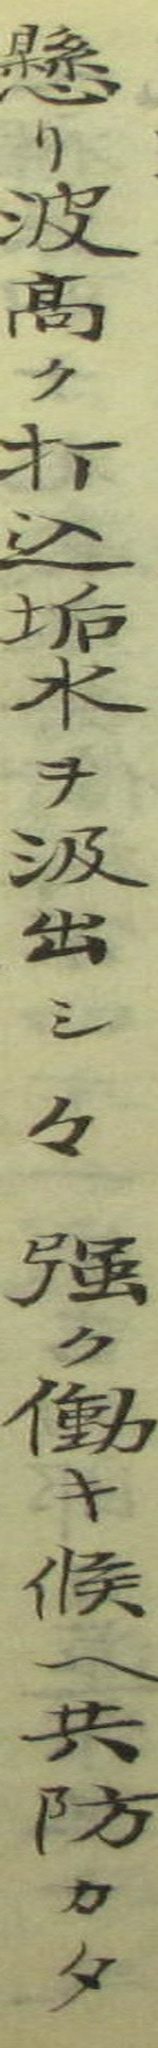懸リ波高ク打込垢水ヲ汲出シ々強ク働キ候ヘ共防カタ
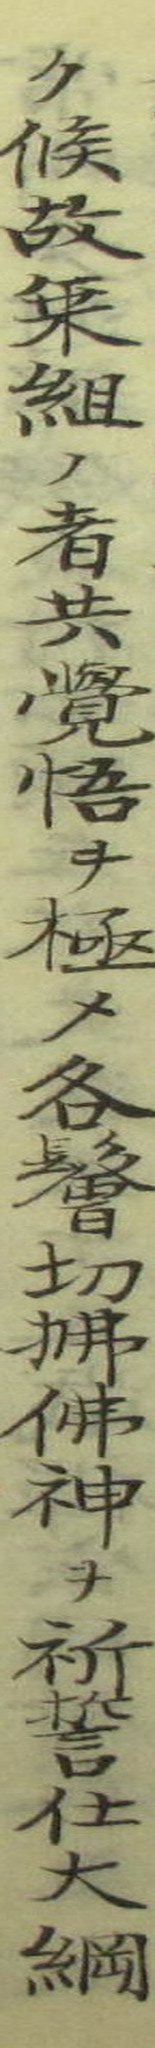ク候故乗組ノ者共覚悟ヲ極メ各鬠切拂佛神ヲ祈誓仕大綱
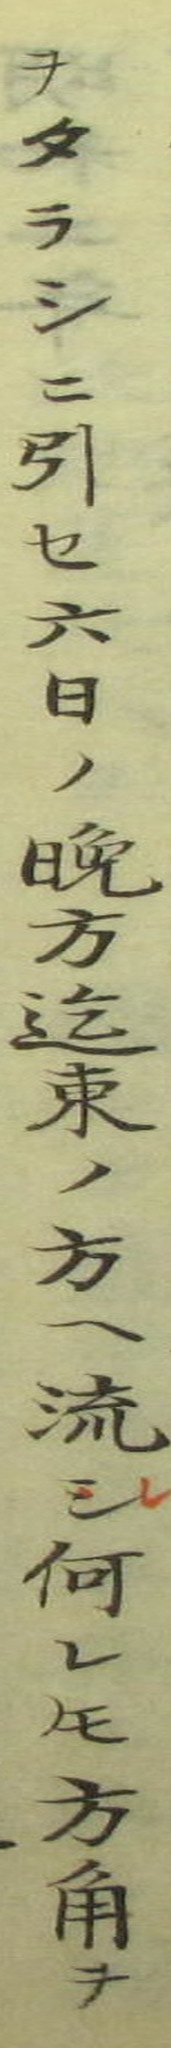ヲタラシニ引セ六日ノ晩方迄東ノ方へ流シレ何レ供方角ヲ
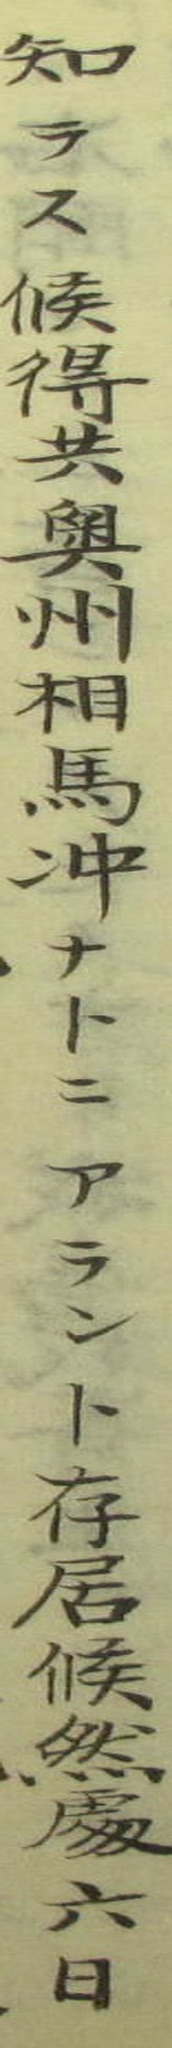知ラス候得共奥州相馬沖ナトニアラント存居候然處六日
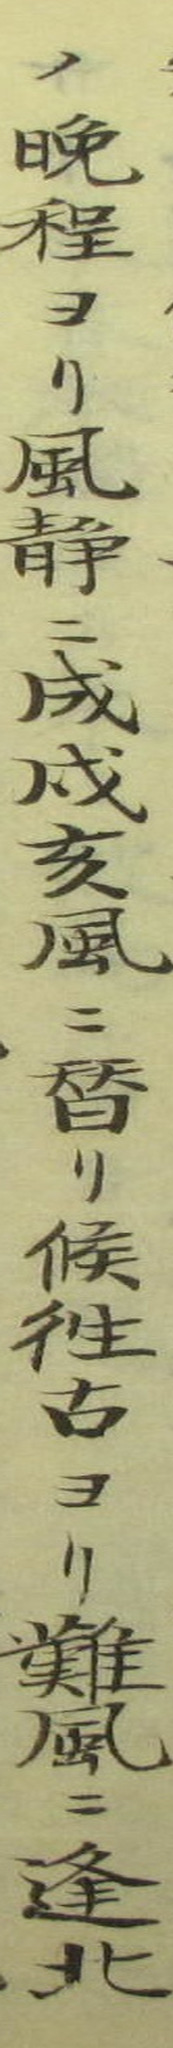ノ晩程ヨリ風静ニ成戌亥風ニ替リ候往古ヨリ難風ニ逢北
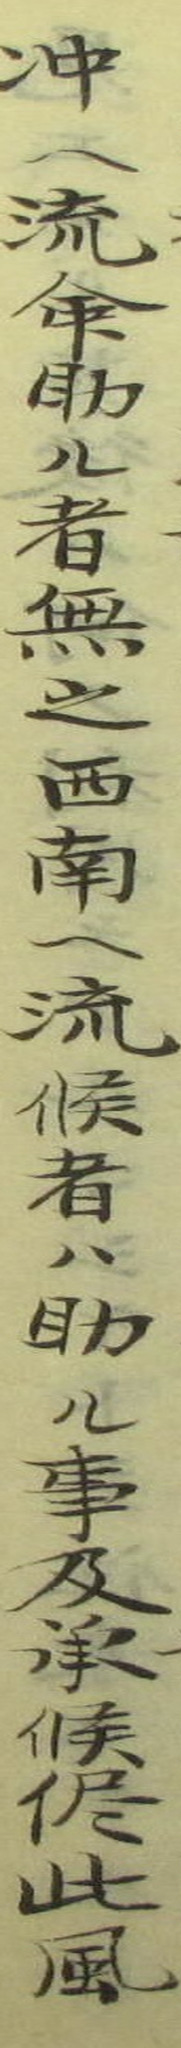沖へ流命助ル者無之西南へ流候者ハ助ル事及承候侭此風
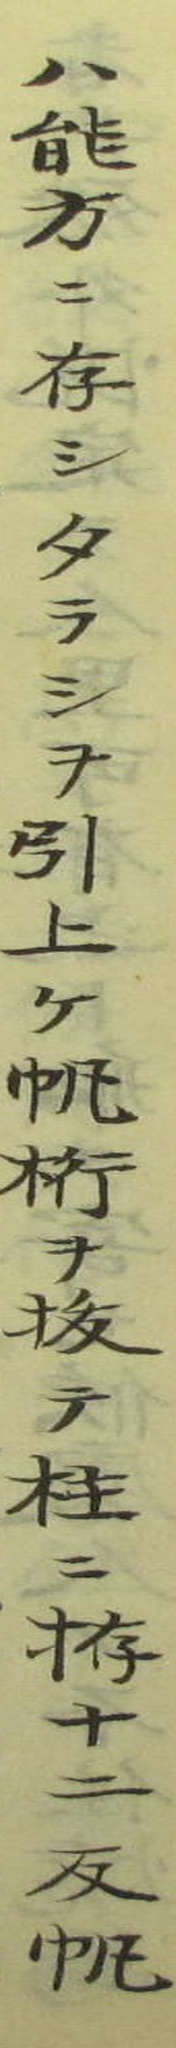ハ能方ニ存シタラシヲ引上ケ帆桁ヲ抜テ柱ニ拵十二反帆
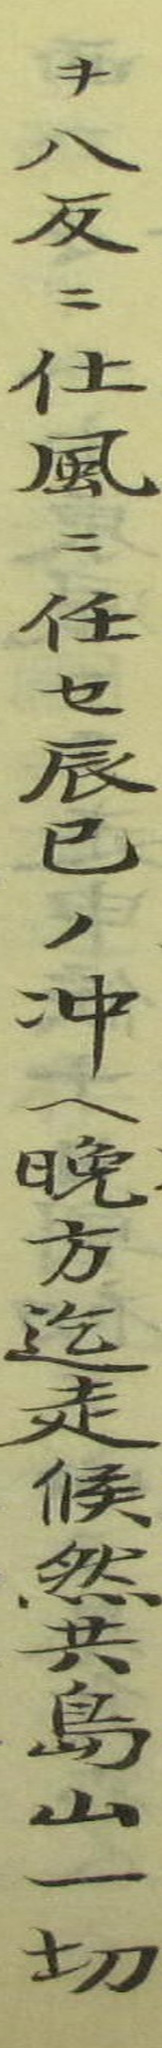ヲ八反ニ仕風ニ任セ辰巳ノ沖へ晩方迄走候然共島山一切
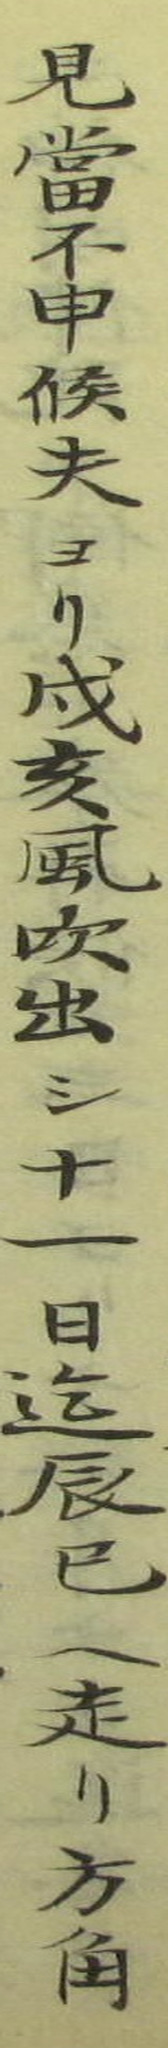見當不申候夫ヨリ戌亥風吹出シ十一日迄辰巳ヘ走リ方角
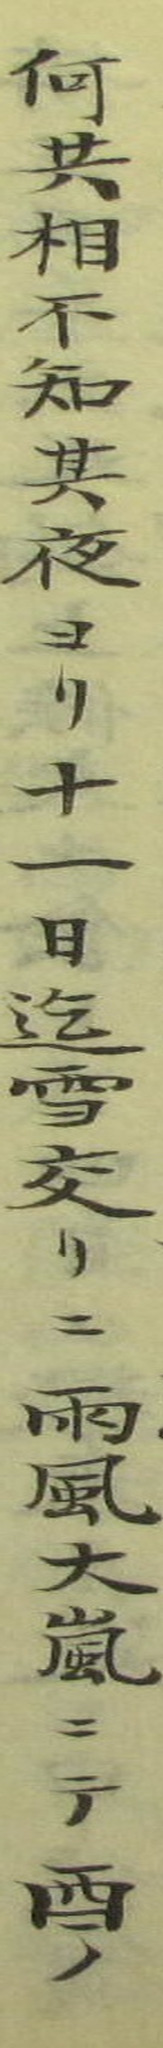何共相不知其夜ヨリ十一日迄雪交リニ雨風大嵐ニテ酉ノ
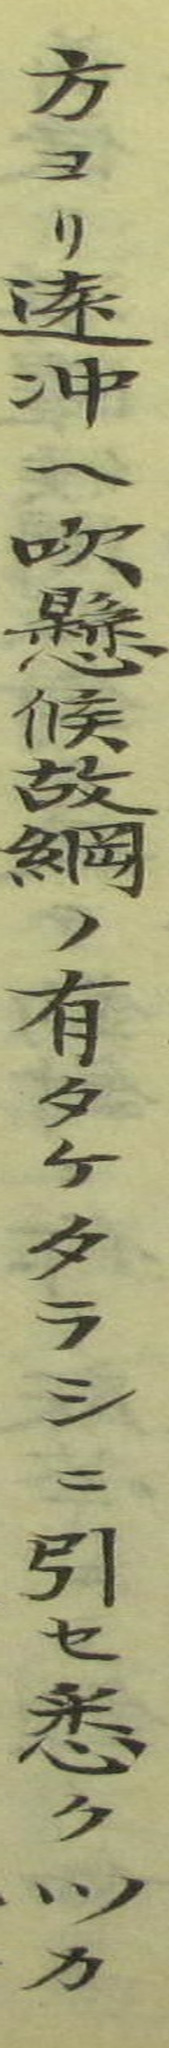方ヨリ遠沖へ吹懸候故綱ノ有タケタラシニ引セ悉クツカ
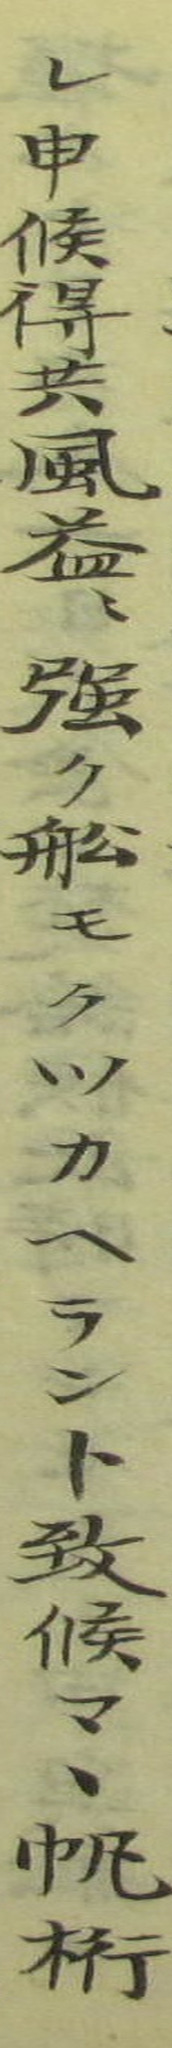レ申候得共風益々強ク舩モクツカヘラント致候マヽ帆桁
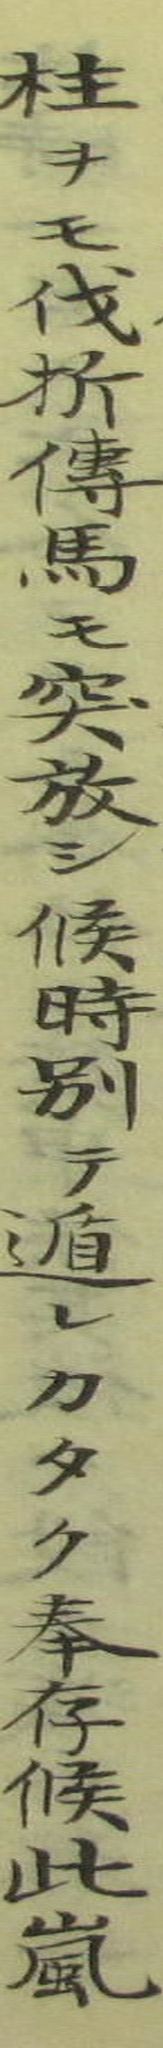柱ヲモ伐折傳馬モ突放シ候時別テ遁レカタク奉存候此嵐
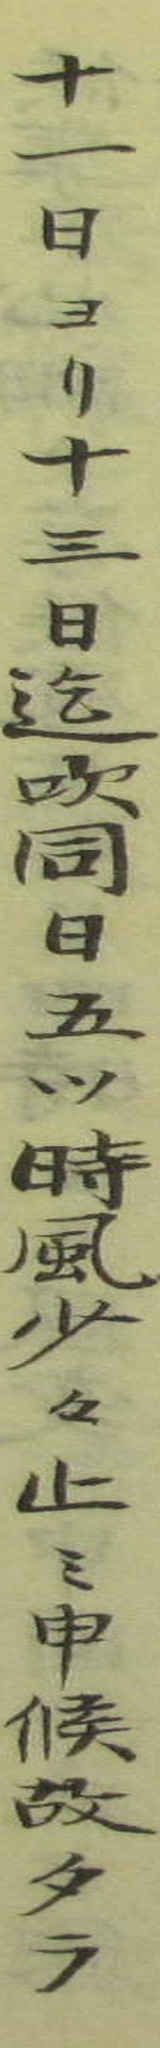十一日ヨリ十三日迄吹同日五ツ時風少々止ミ申候故タラ
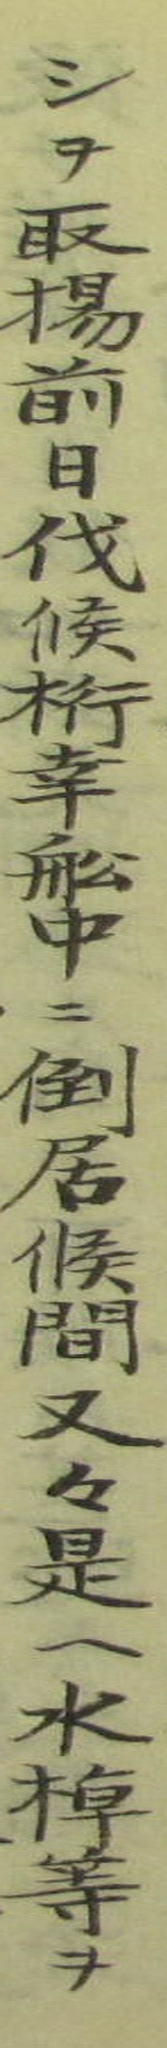シヲ取揚前日伐候桁幸舩中ニ倒居候間又々是へ水棹等ヲ
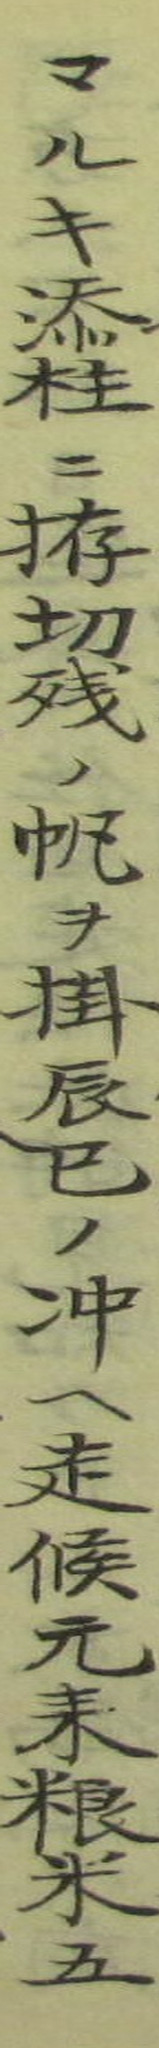マルキ添柱ニ拵切残ノ帆ヲ掛辰巳ノ沖へ走候元来粮米五
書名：異国船漂着記 外二
